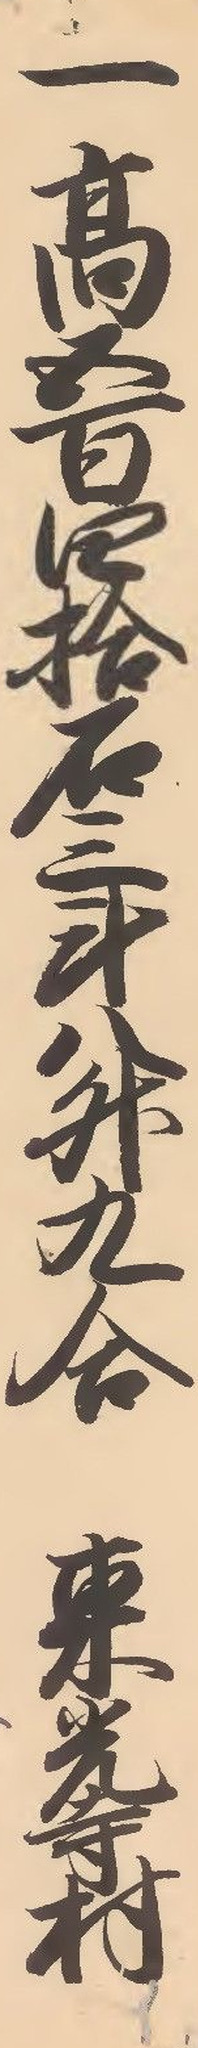一高五百四拾石三斗八升九合東光寺村
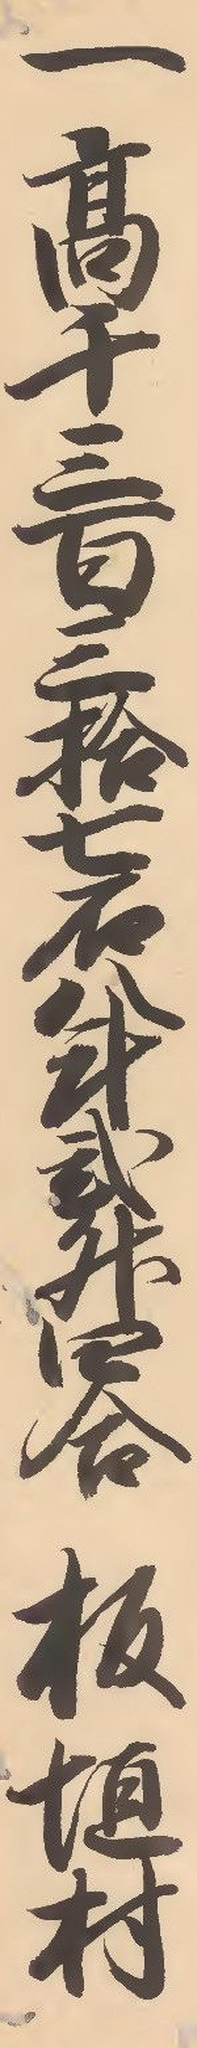一高千三百三拾七石八斗弐升四合板垣村

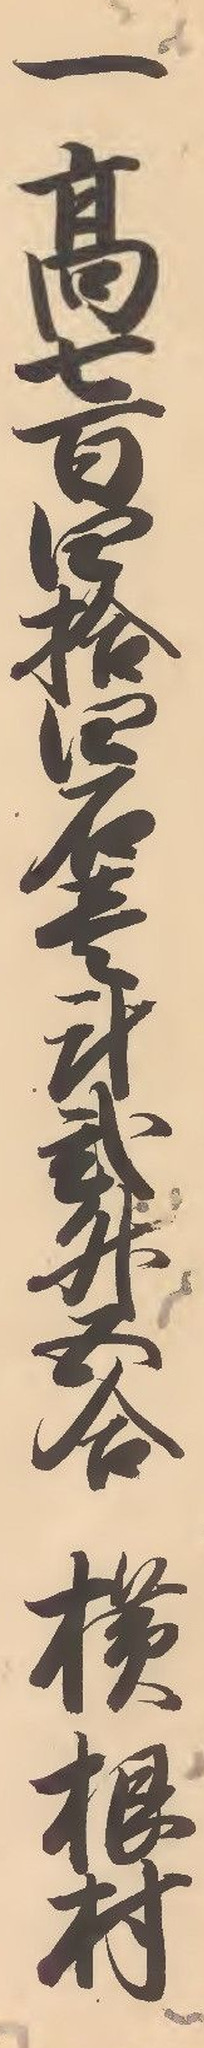一高七百四拾四石壱斗弐升五合横根村
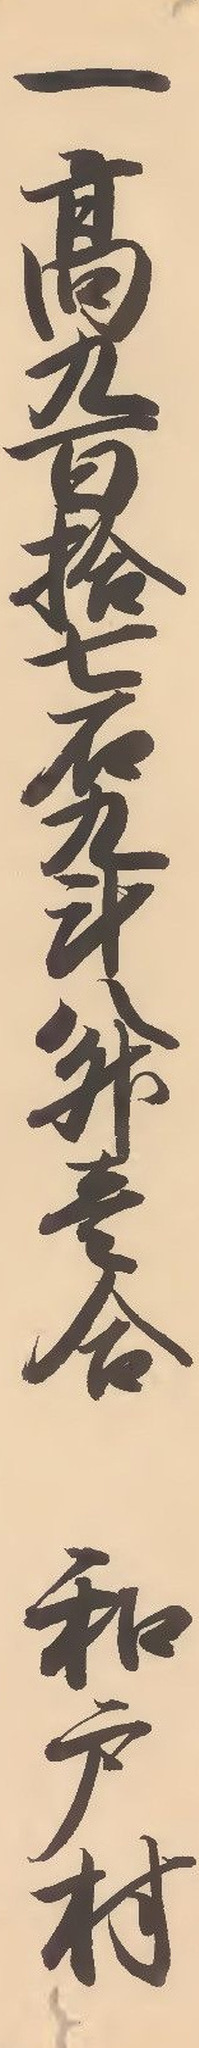一高九百拾七石九斗八升壱合和戸村
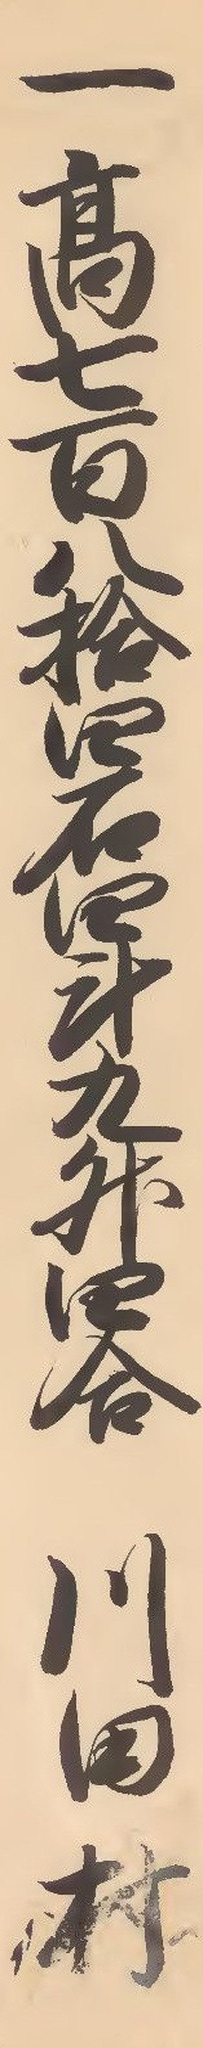一高七百八拾四石四斗九升四合川田村
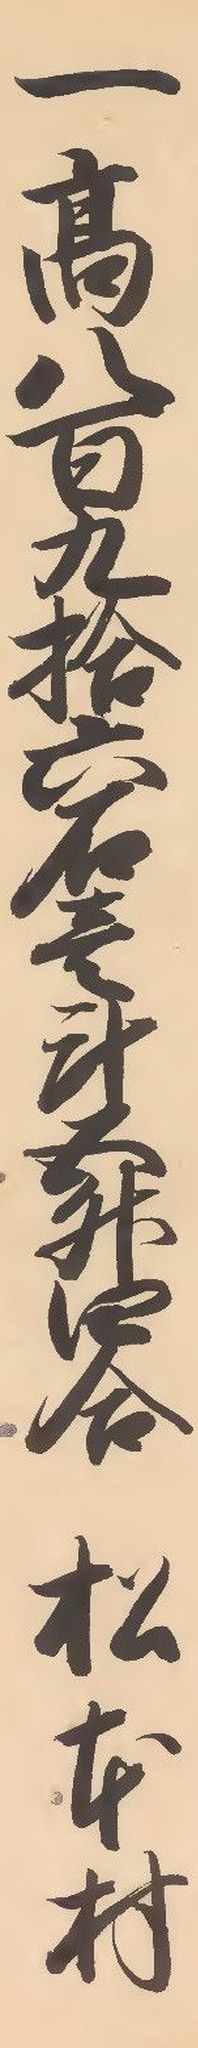一高八百九拾六石壱斗五升四合松本村
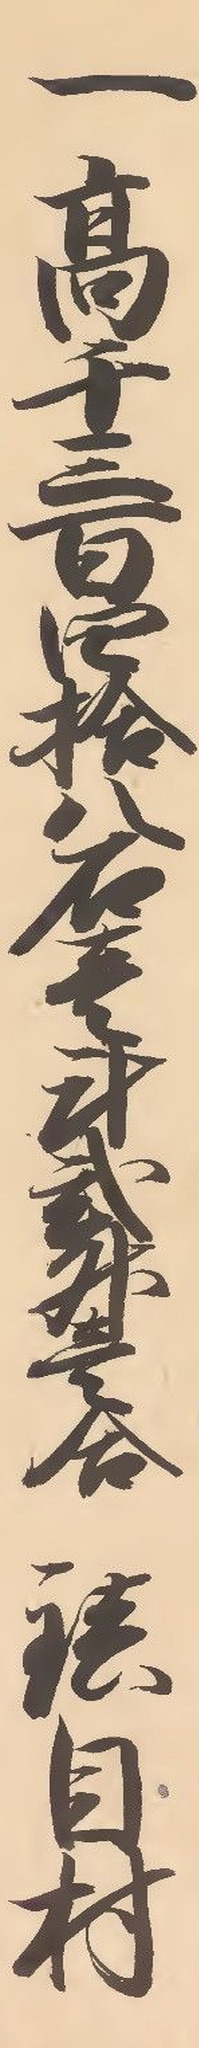一高千三百四拾八石壱斗弐升壱合鎮目村
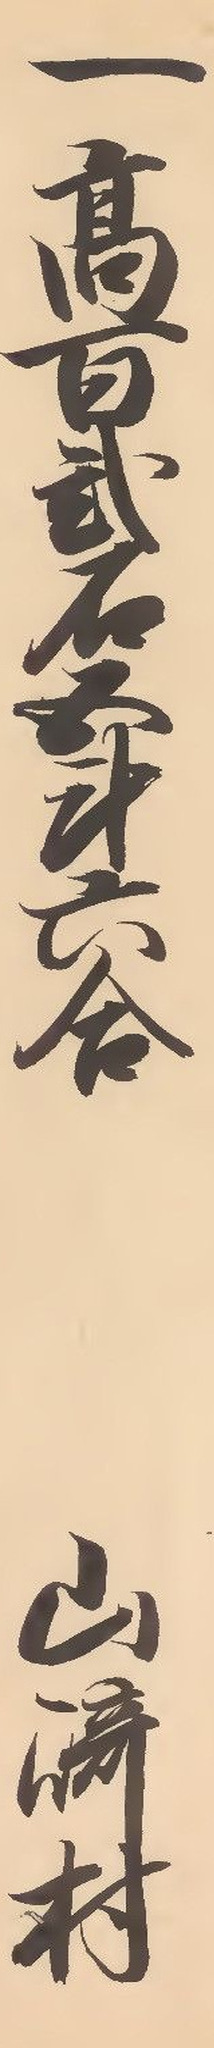一高百弐石五斗六合山崎村
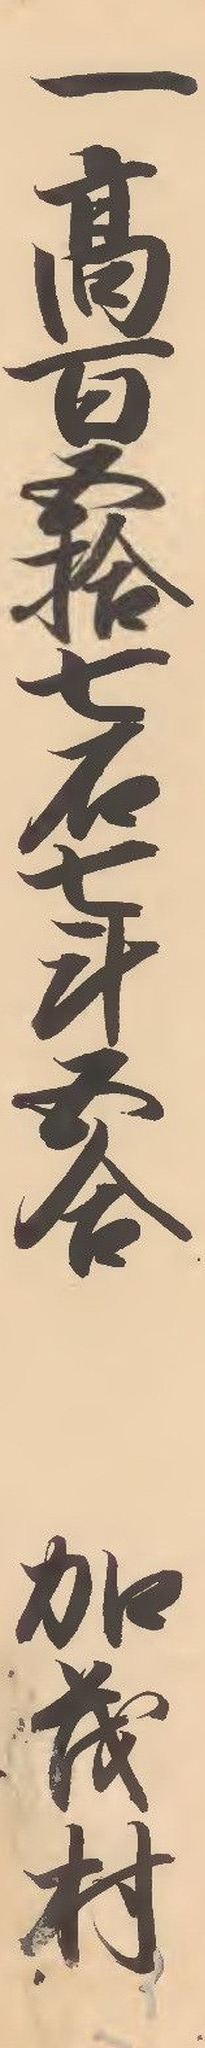一高百五拾七石七斗五合加茂村
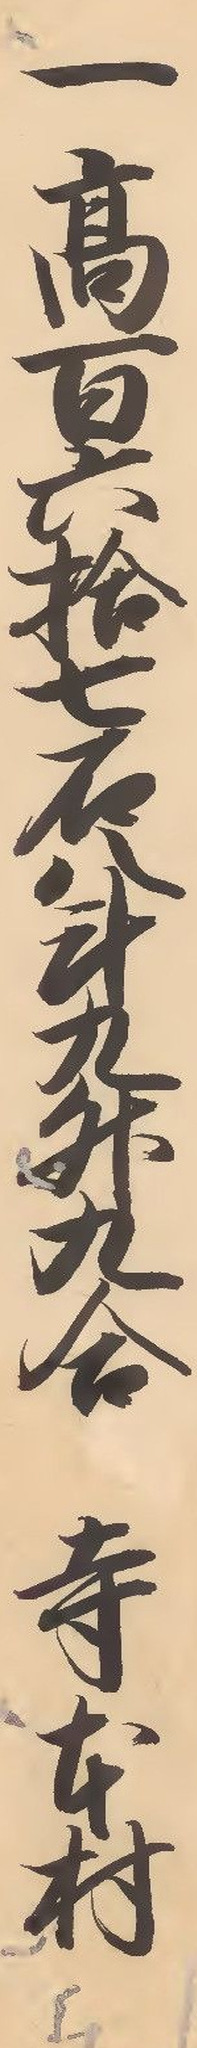一高百六拾七石八斗九升九合寺本村

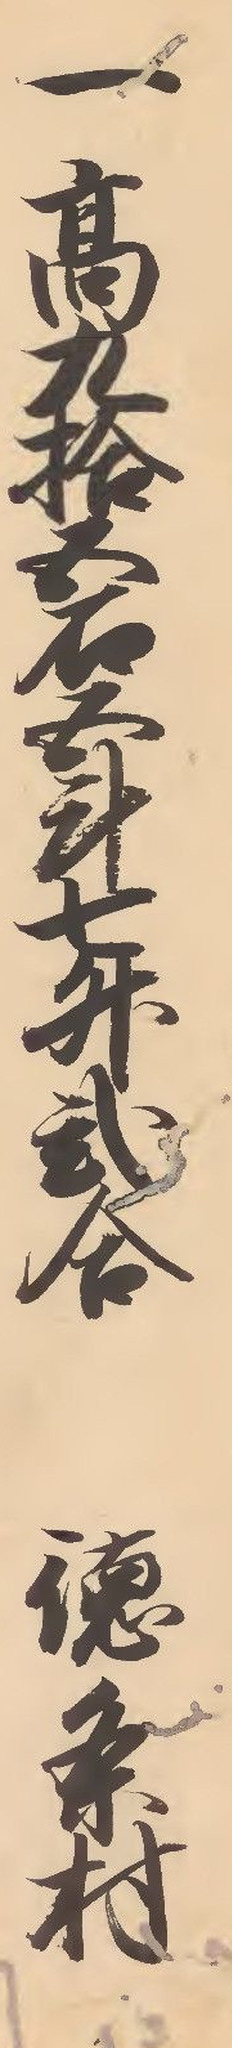一高九拾五石五斗七升弐合徳条村
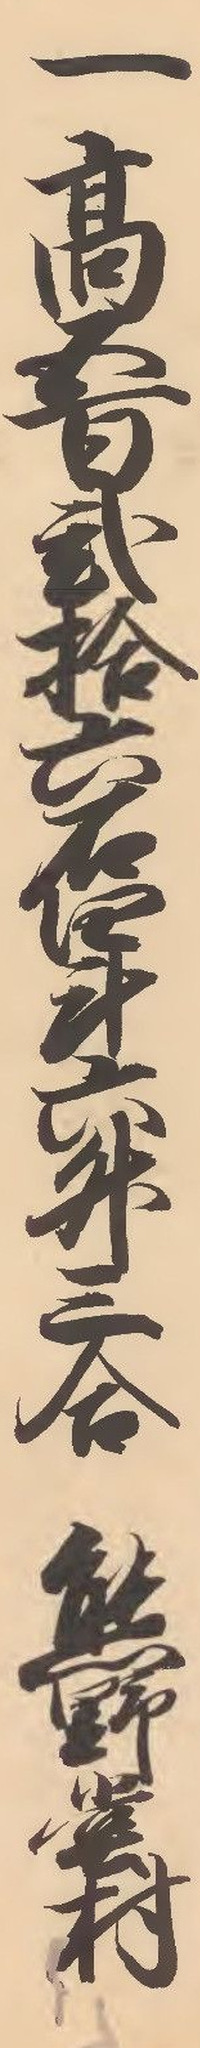一高五百弐拾六石四斗六升三合熊野堂村
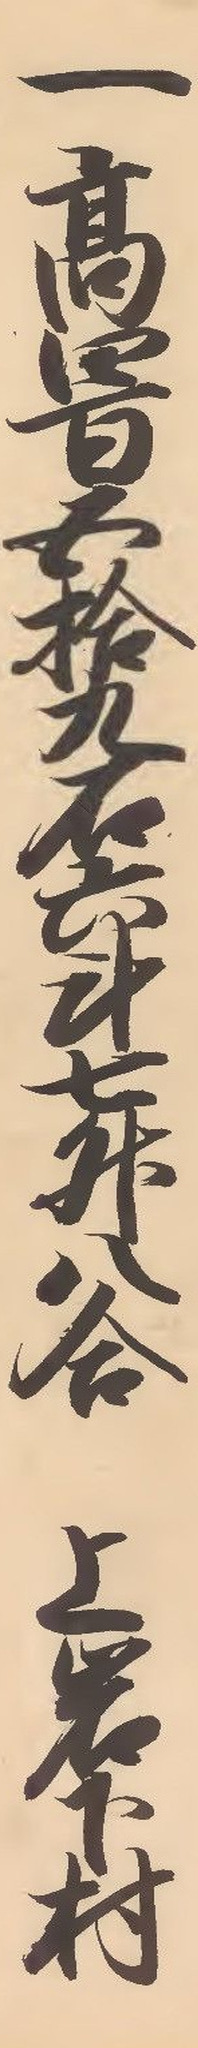一高四百五拾九石六斗七升八合上岩下村
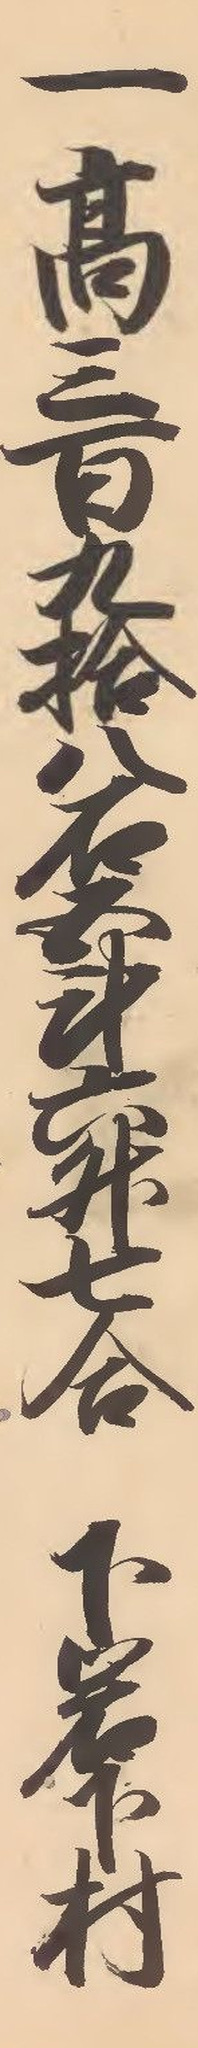一高三百九拾八石五斗六升七合下岩下村
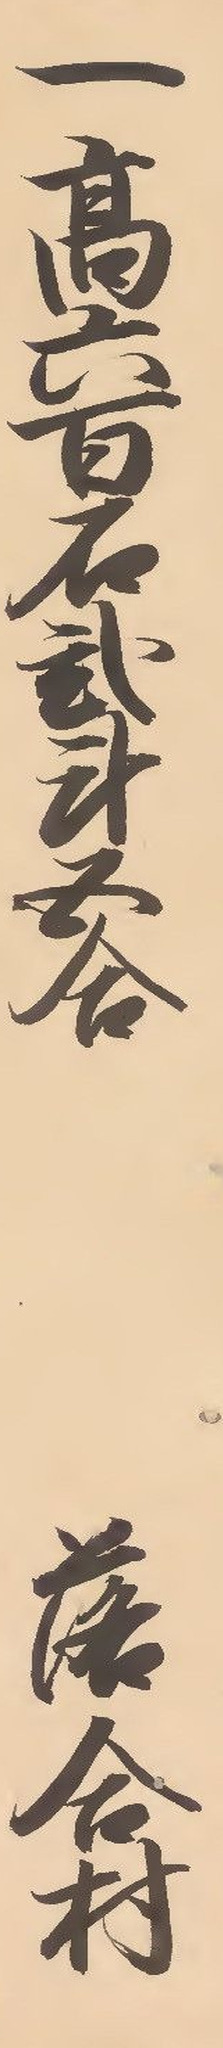一高六百石弐斗五合落合村
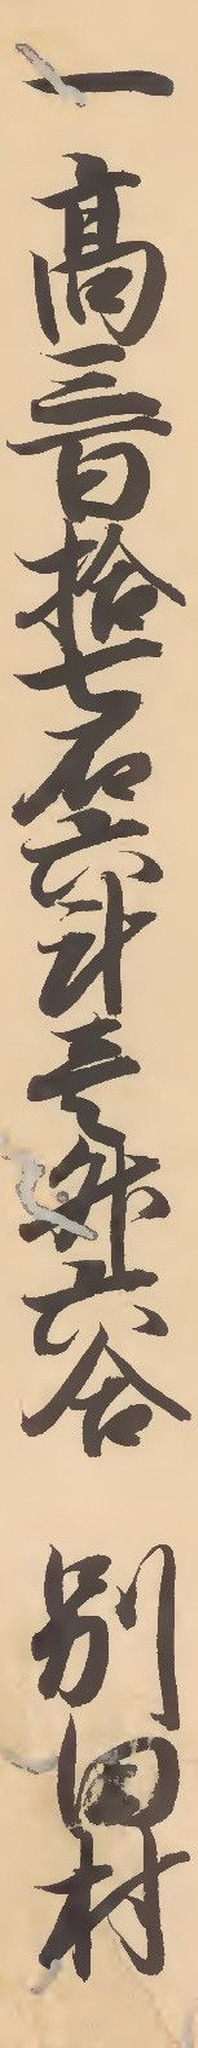一高三百拾七石六斗壱升六合別田村
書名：甲斐国郷帳
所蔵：国立公文書館 National Archives of Japan
